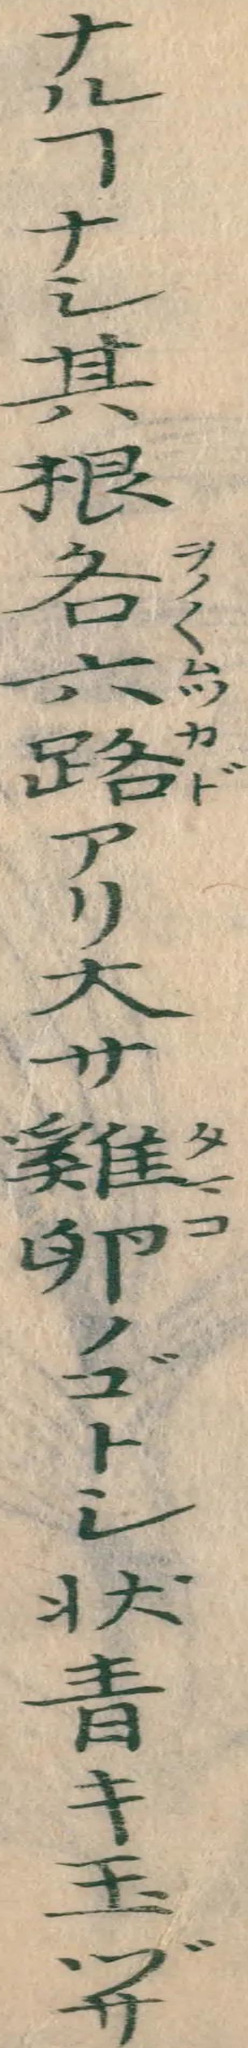ナルコトナシ其根各六路アリ大サ鶏卵ノゴトシ状青キ玉ヅサ
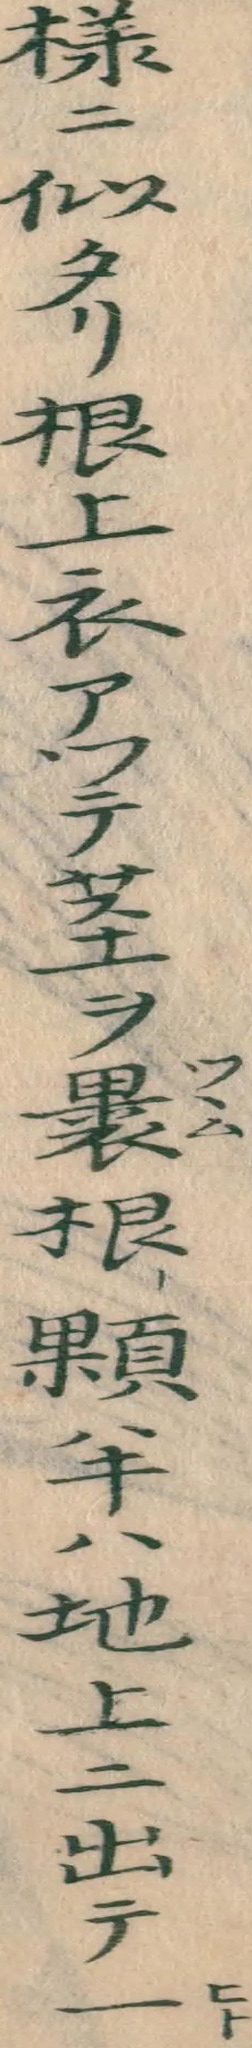様ニ似タリ根上衣アツテ茎ヲ褁根-顆半ハ地上ニ出テ一
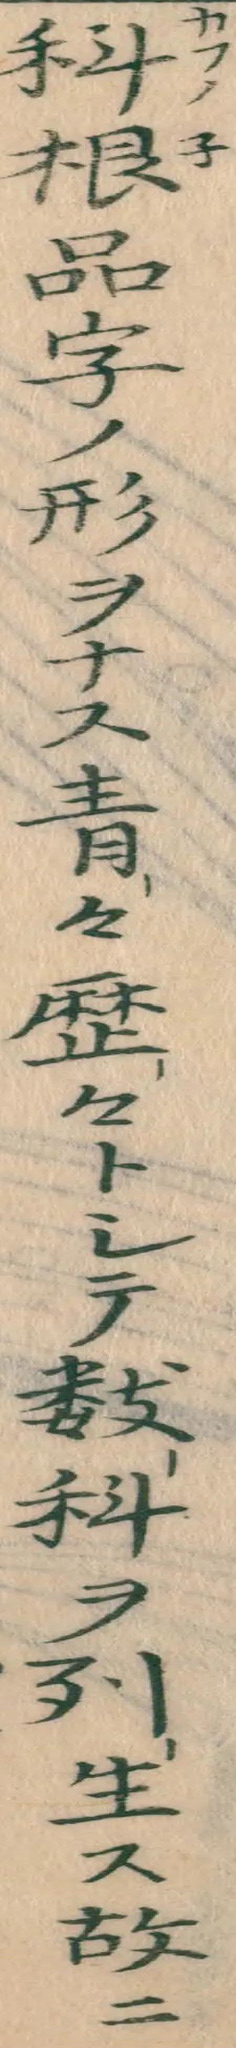科根品字ノ形ヲナス青-々歴-々トシテ数-科ヲ列-生ス故ニ
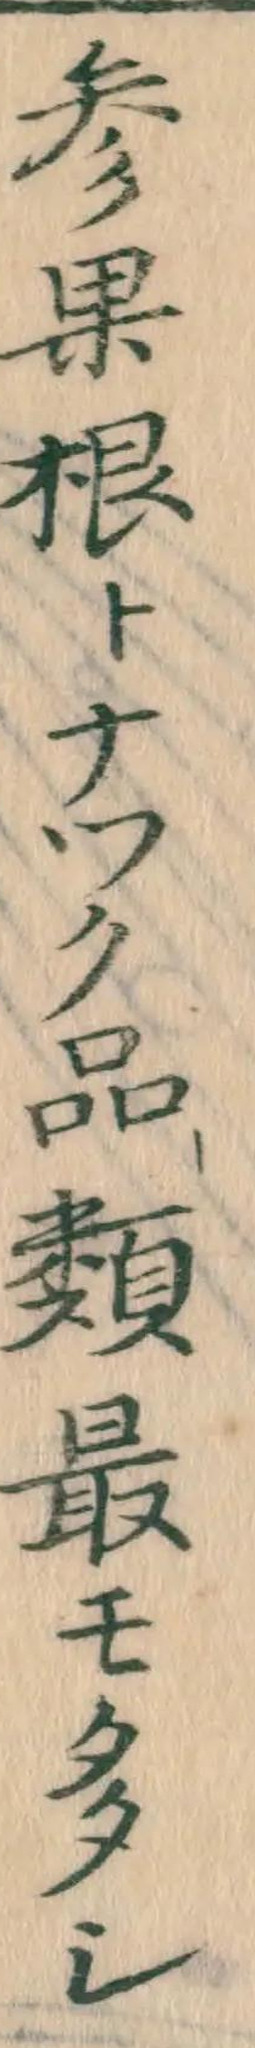参果根トナツク品-類最モ多シ

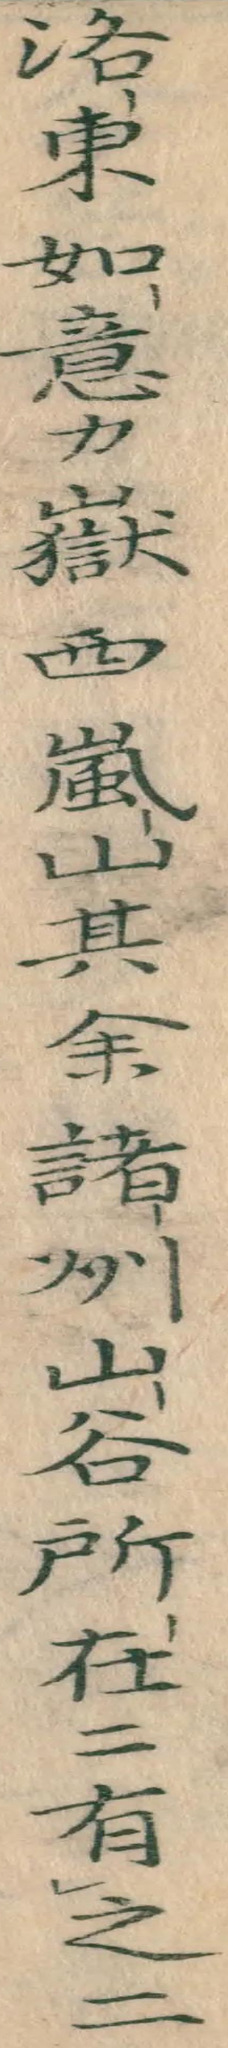洛-東如-意カ岳西嵐-山其余諸-州山-谷所-在ニ有之二
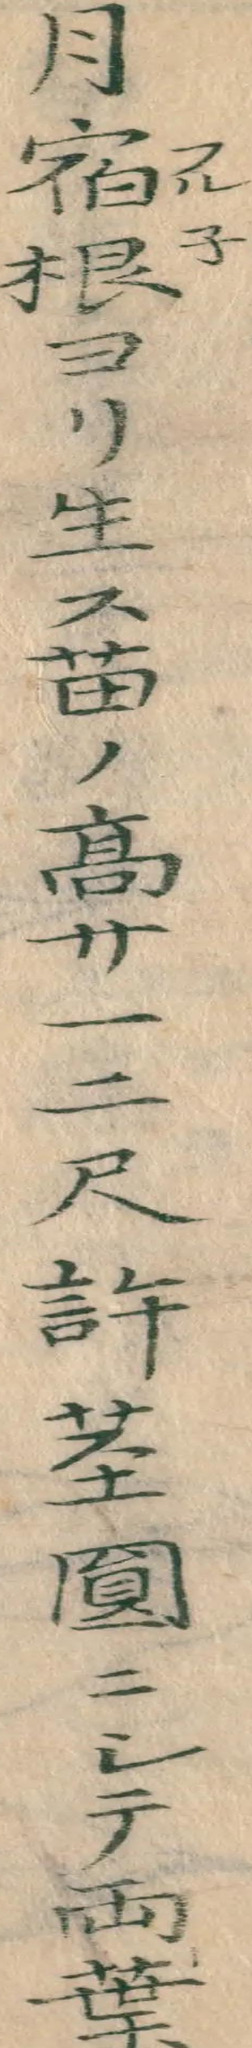月宿根ヨリ生ス苗ノ高サ一二尺許茎円ニシテ両-葉
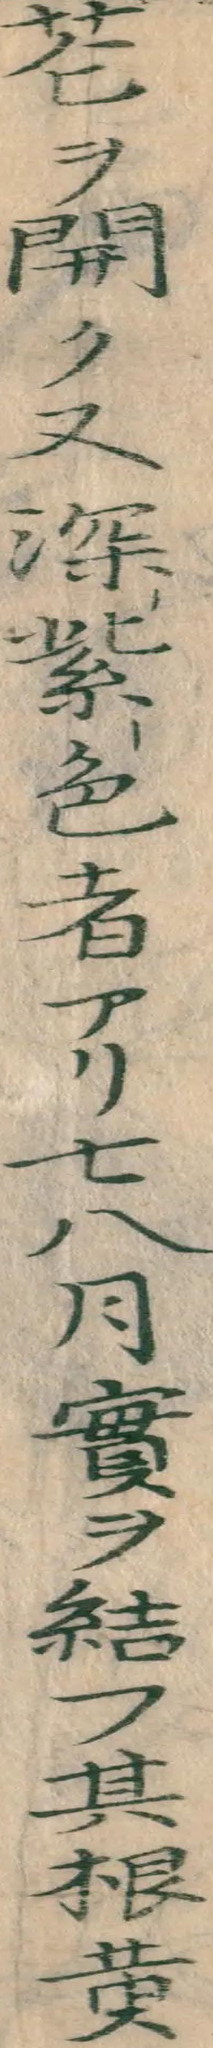花ヲ開ク又深-紫-色者アリ七八月実ヲ結フ其根黄
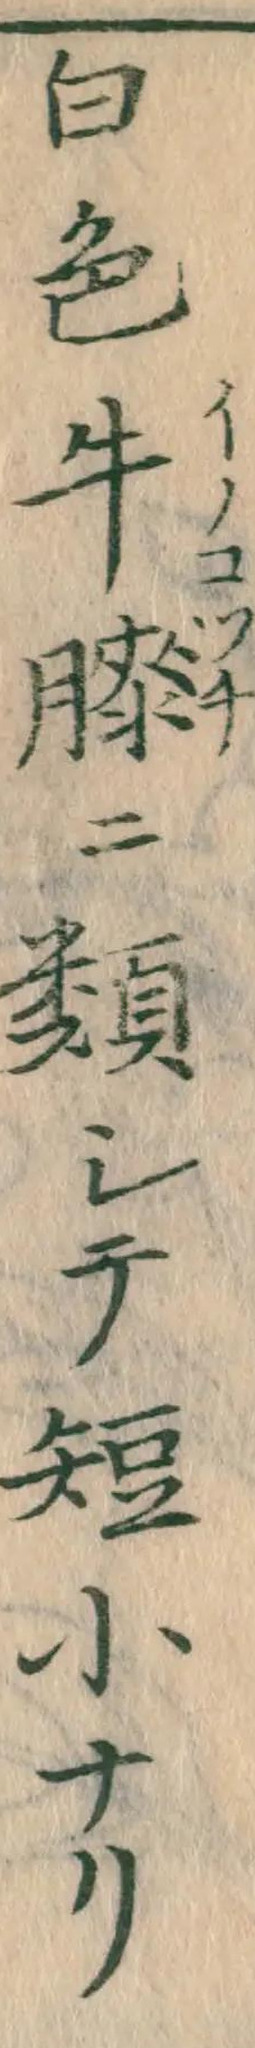白色牛膝ニ類シテ短小ナリ

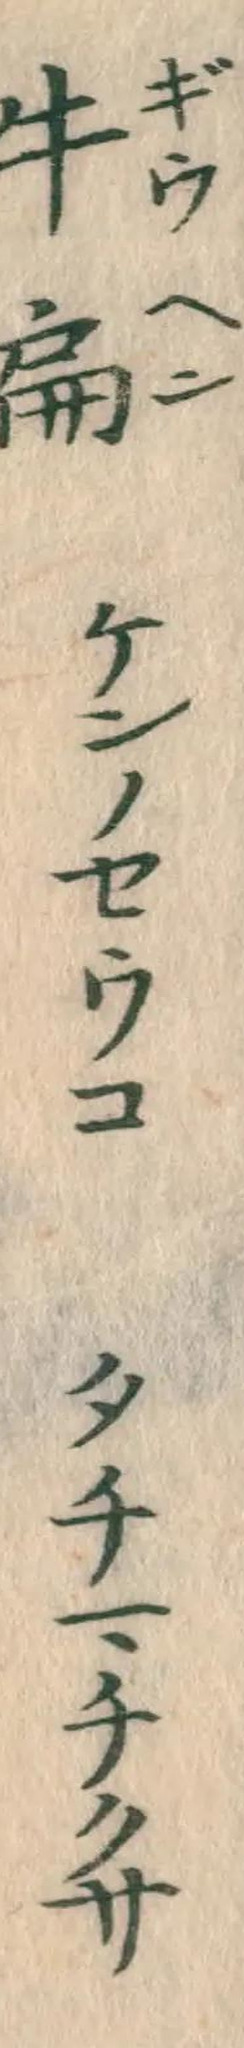牛扁ケンノセウコタチマチクサ
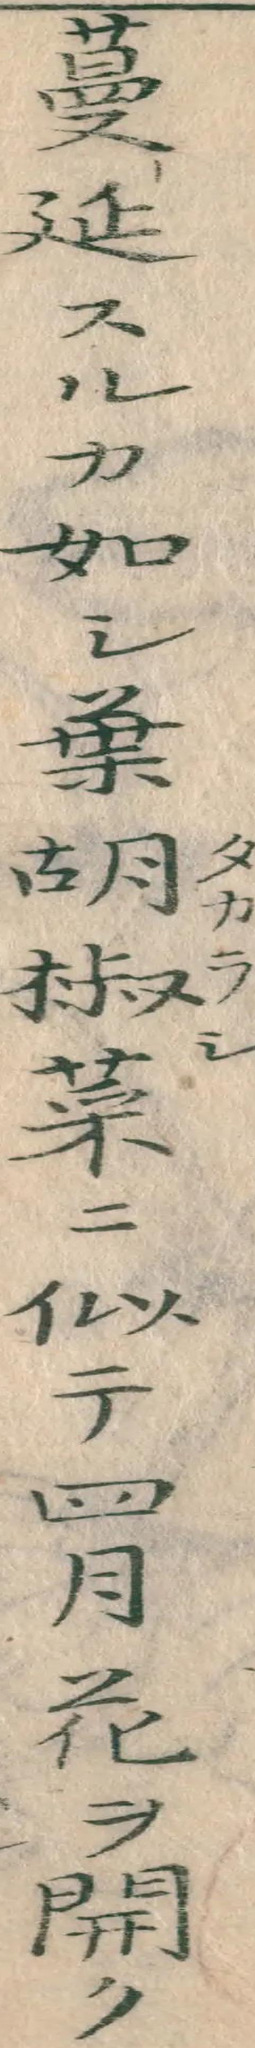蔓-延スルカ如シ葉胡椒菜ニ似テ四月花ヲ開ク
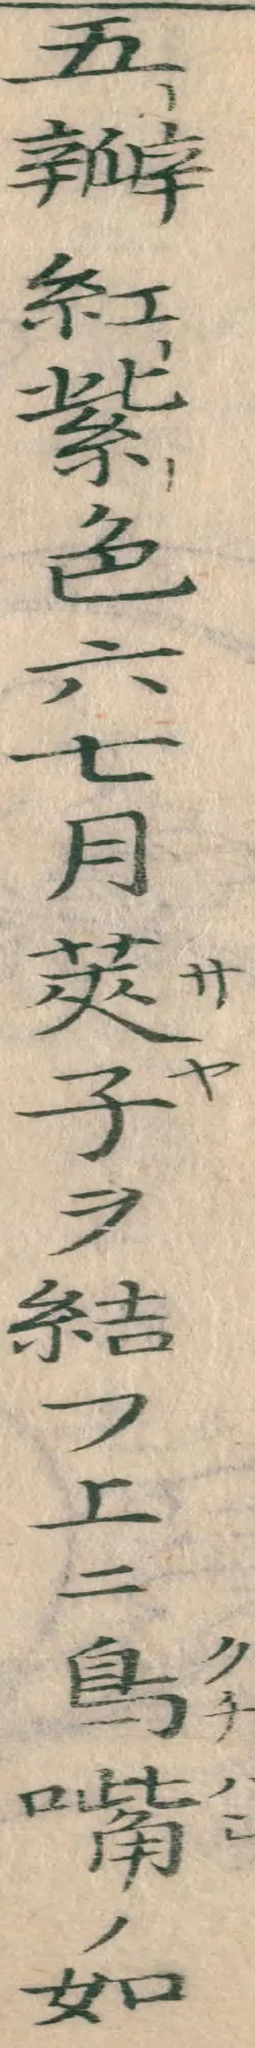五-弁紅-紫-色六七月莢子ヲ結フ上ニ鳥嘴ノ如
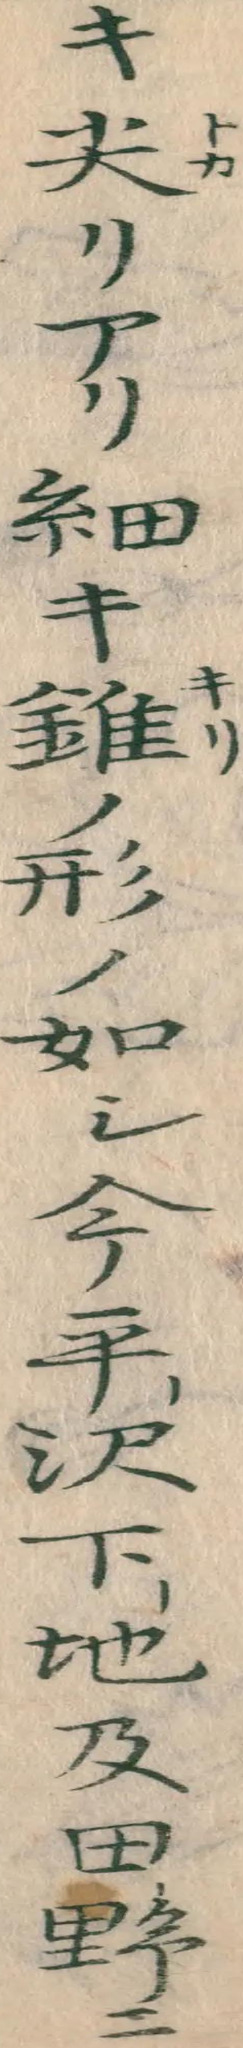キ尖リアリ細キ錐ノ形ノ如シ今平-沢下-地及田-野ニ
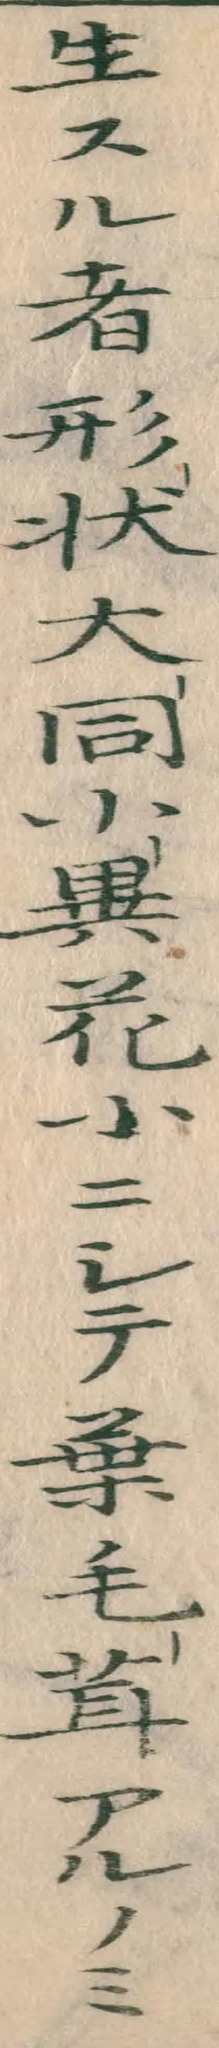生スル者形-状大-同小-異花小ニシテ葉毛-茸アルノミ
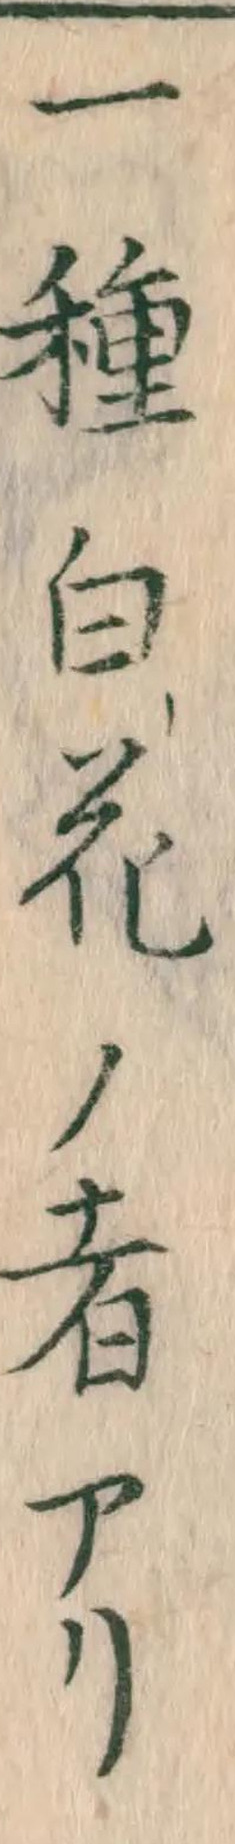一種白-花ノ者アリ

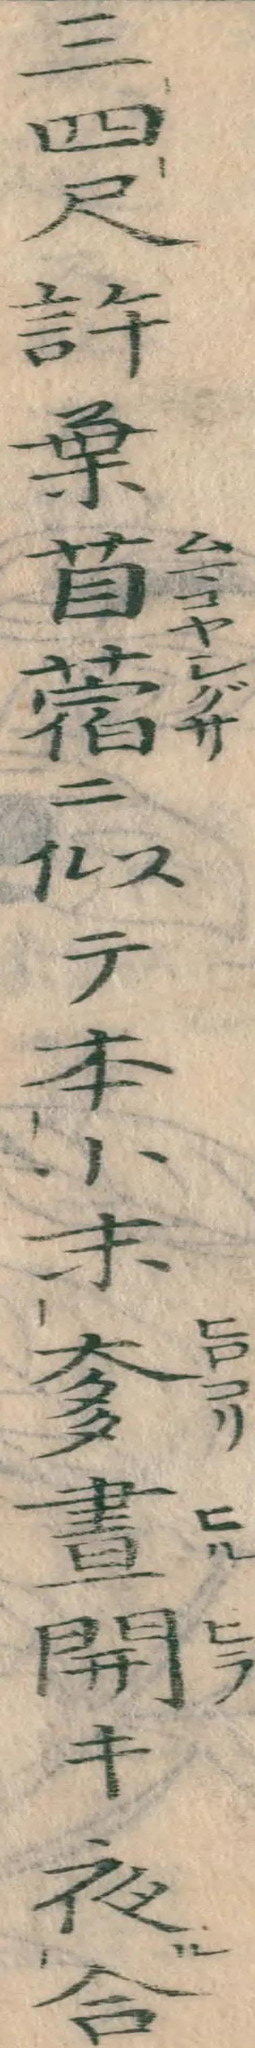三-四-尺許葉苜蓿ニ似テ本-小末-奓昼開キ夜-合
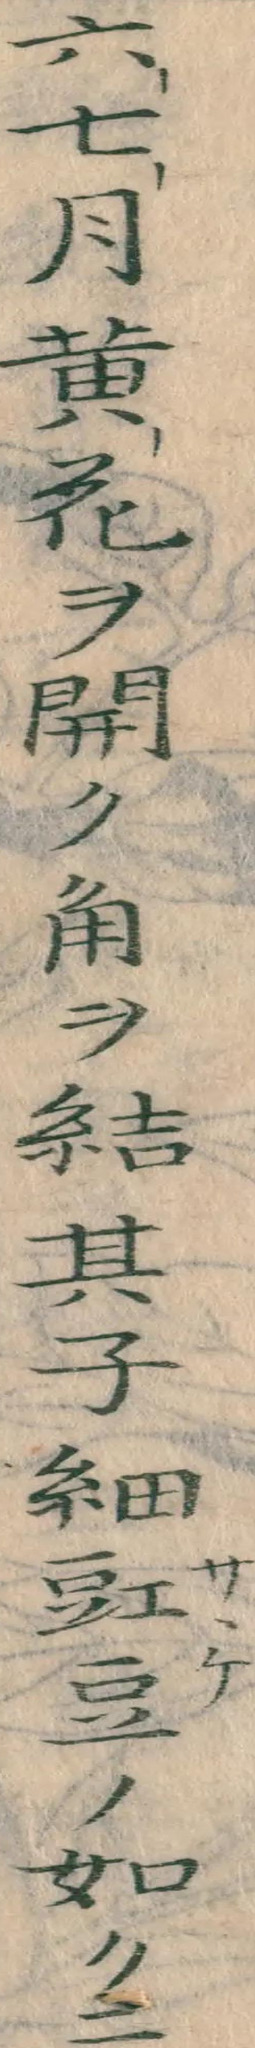六-七-月黄-花ヲ開ク角ヲ結其子細豇豆ノ如クニ
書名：花彙 草部4巻木部4巻. [1]
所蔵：国立国会図書館 National Diet Library, JAPAN
